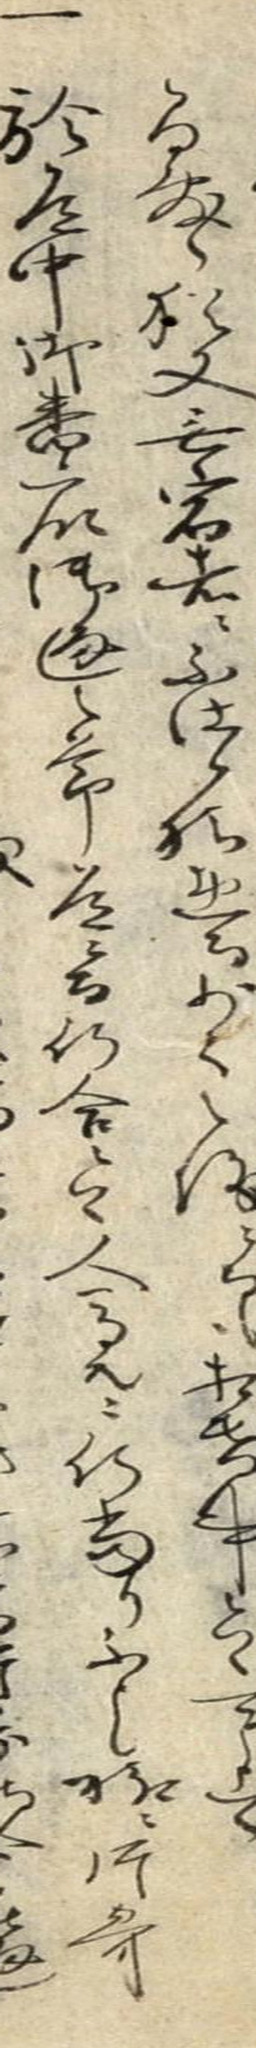一於道中御番衆御通之節道にて行合候はゝ人馬共に行当り不申候様に片寄
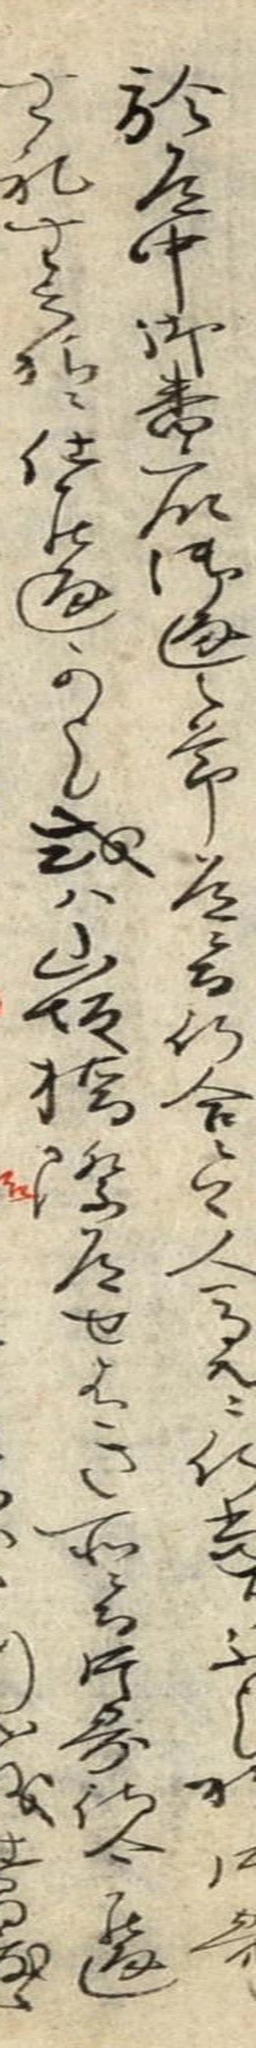無礼無之様に仕罷通可申候或は山坂橋際道せはき所にて片寄待合罷通
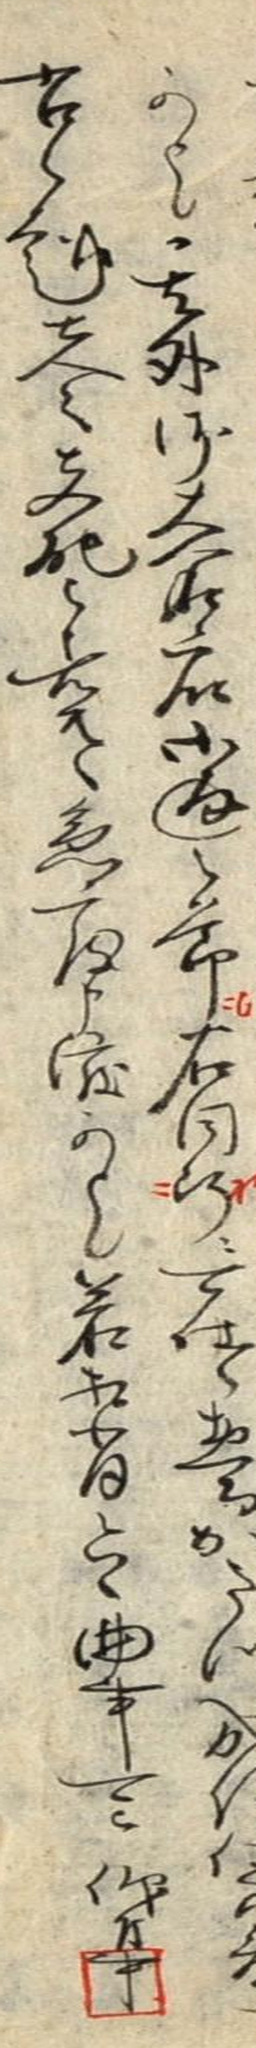右之趣夫々支配之者共へ急度申渡可申候若相背候はゝ曲事可被仰付事

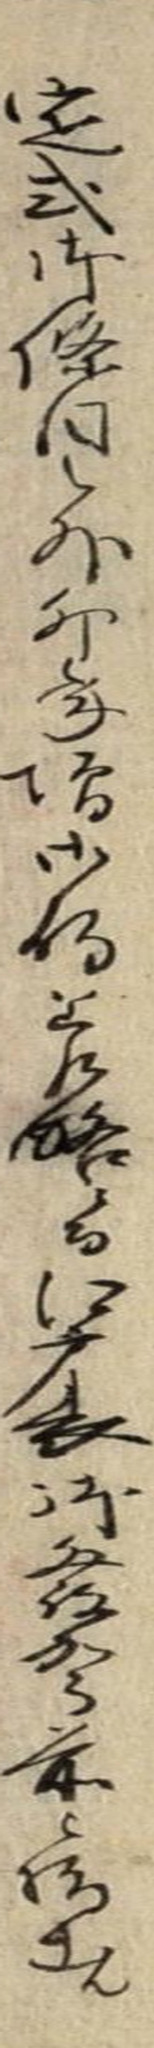一定式御條目之外卯年増御触差略にて江戸表御発駕前に指出る
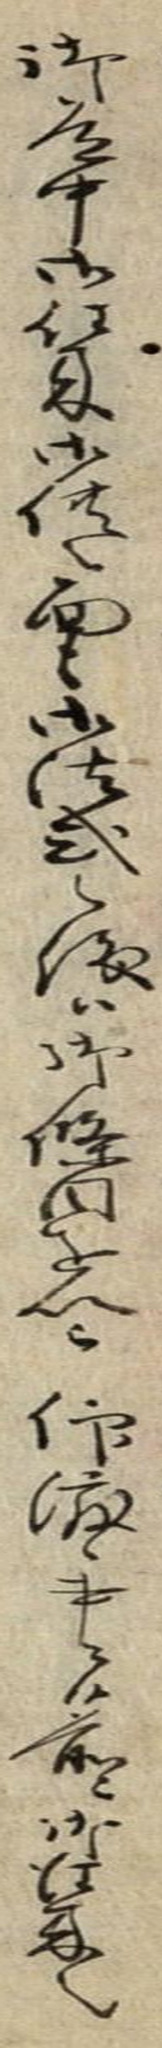御道中御往来御供之面々御法式之儀は御條目を以被仰渡候事に候前々御往来之
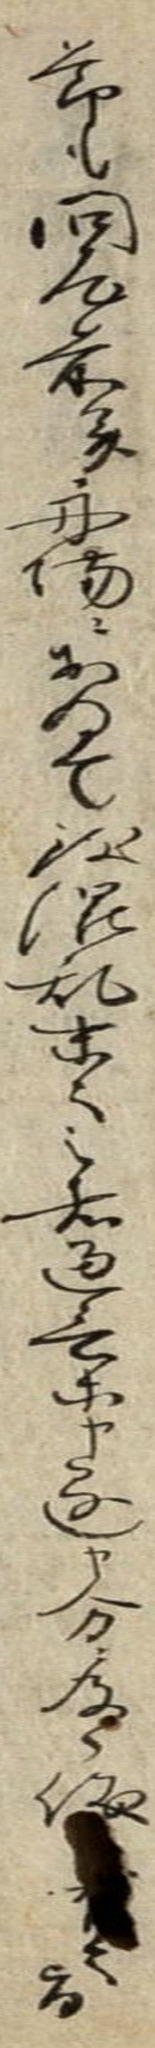節も問屋前并舟場におゐて致混乱末々之者過言等申懸申分に及候儀之旨
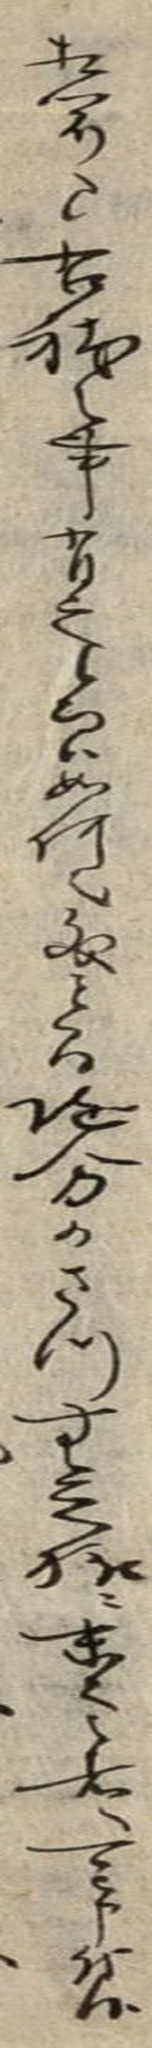相聞へ候右体之事有之候ては如何之義に候間随分かさつ無之様に末々之者へ可被申付候
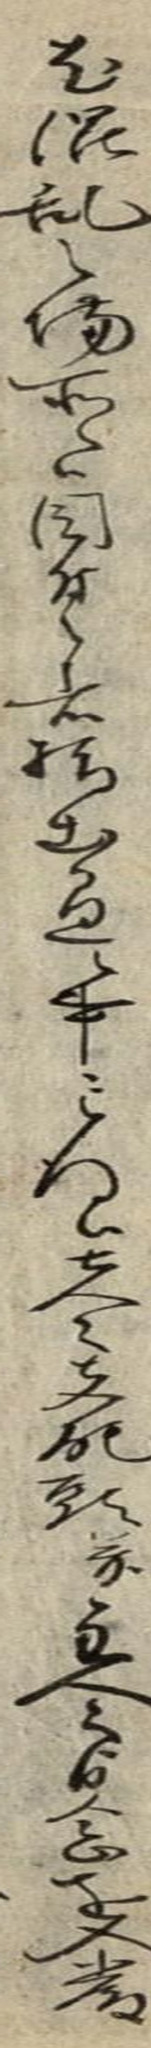尤混乱之場所へは目付之者指出置候事に候得は夫々支配頭并主人々ゟ念を入厳
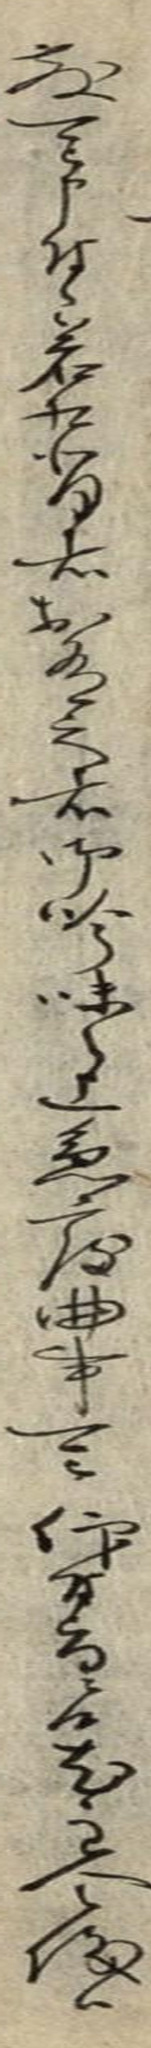敷可被申付候若相背者於有之御吟味之上急度曲事可被仰付旨に候尤主人之儀は
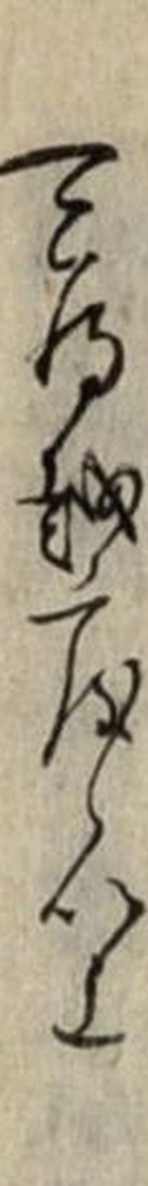可為越度候以上
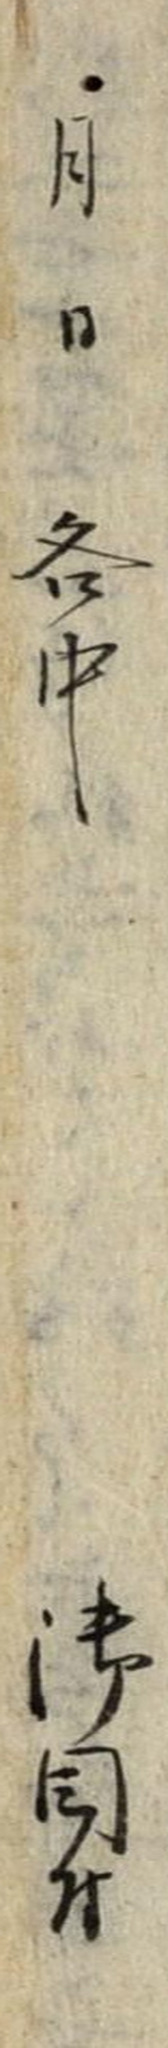月日各中御目付
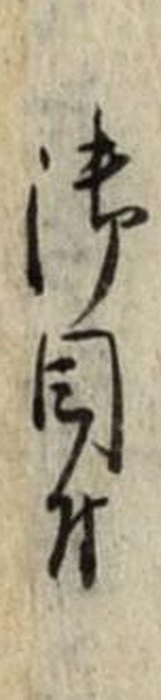御目付
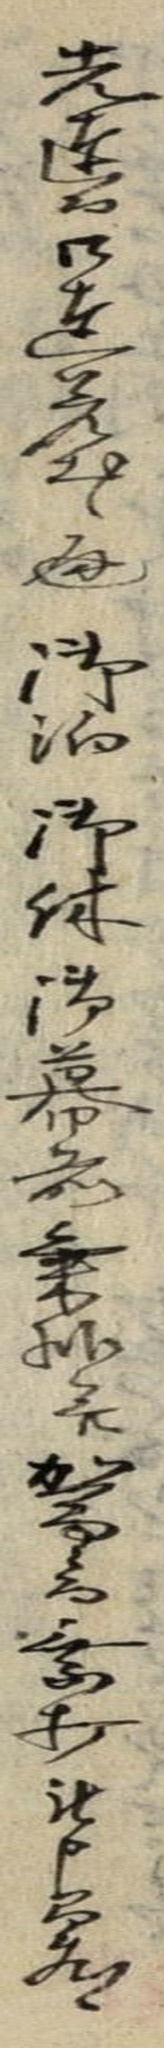先達て口達差出候通御泊御休御幕前乗掛并駕にて乗打被申間敷候
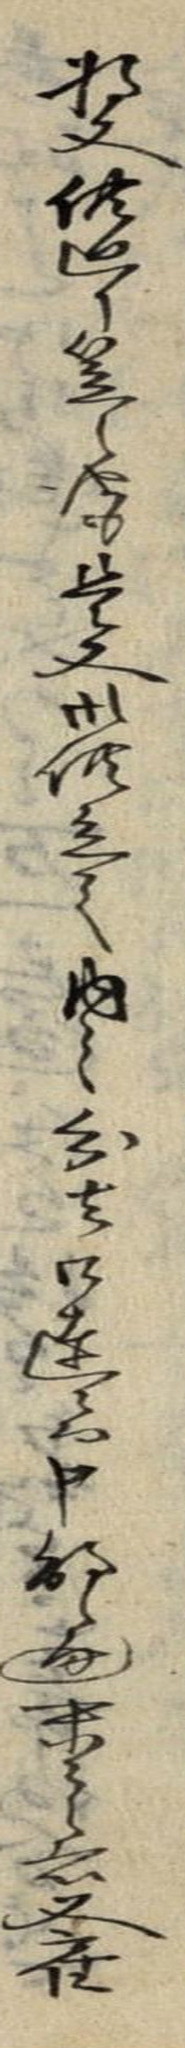猶又供廻り笠之儀も是又御供立之内之分は口達にて申触之通末々之者又雇
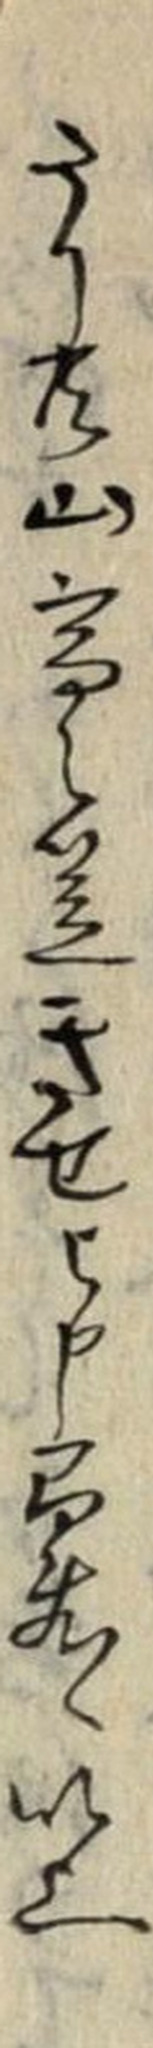たり共山高之笠きせ被申間敷候以上
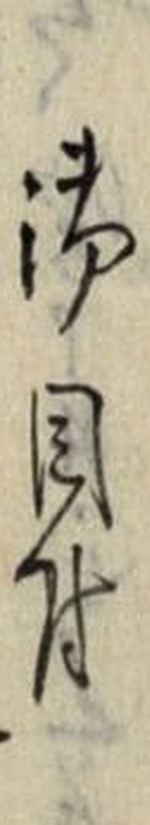御目付
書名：三都并道中之部
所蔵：福井県文書館 Fukui Prefectural Archives
